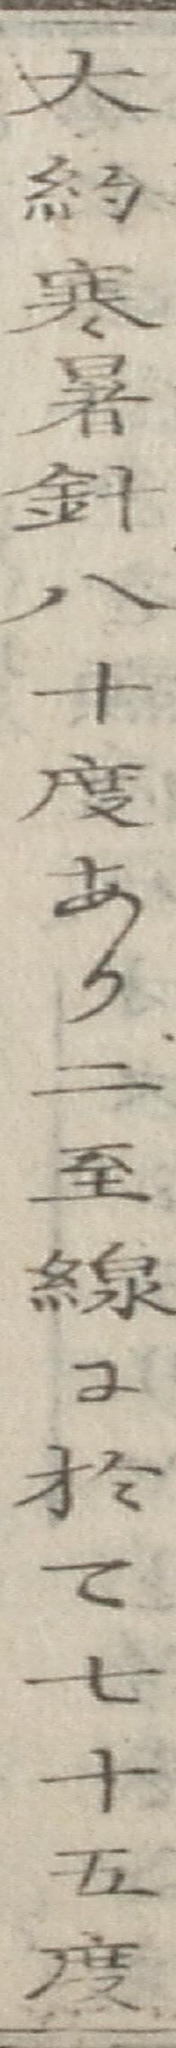大約寒暑針八十度あり、二至線に於て七十五度、
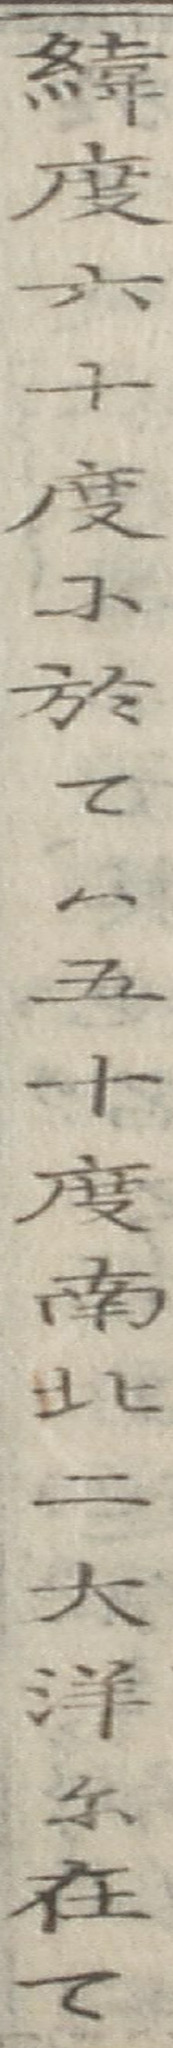緯度六十度に於ては五十度、南北二大洋に在て
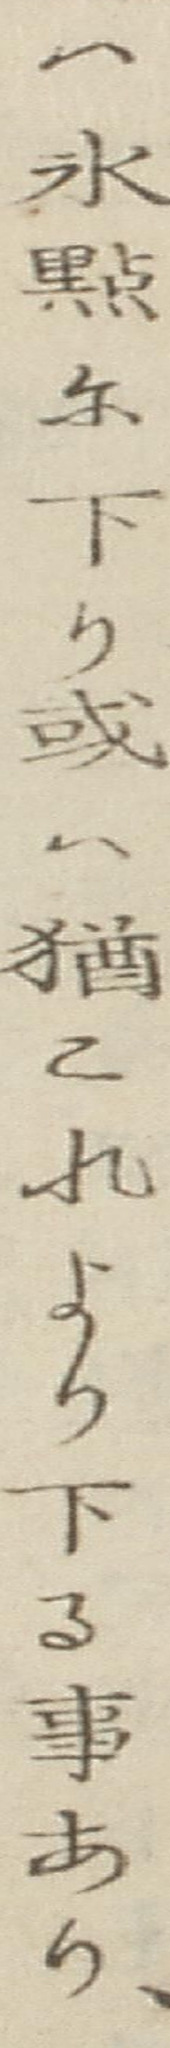は氷点に下り、或は猶これより下る事あり、
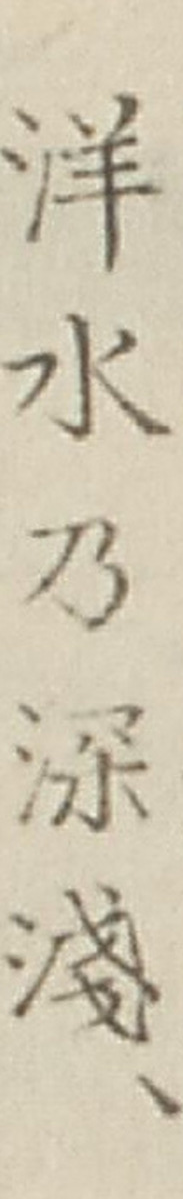洋水の深浅、
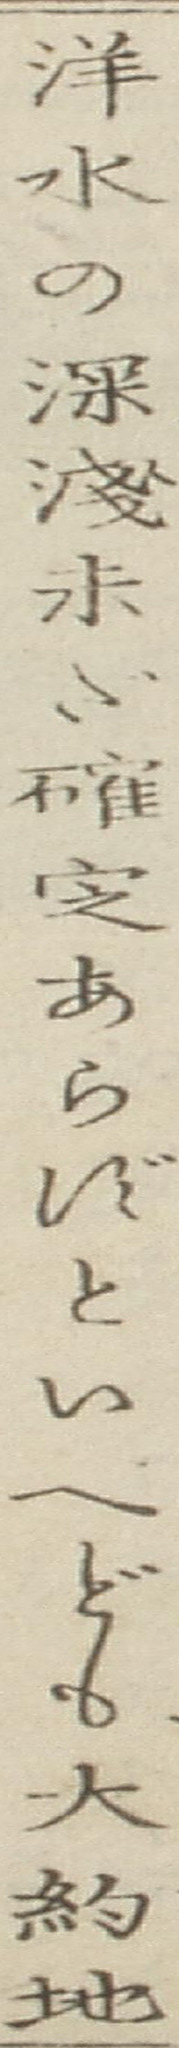洋水の深浅未だ確定あらずといへども、大約地
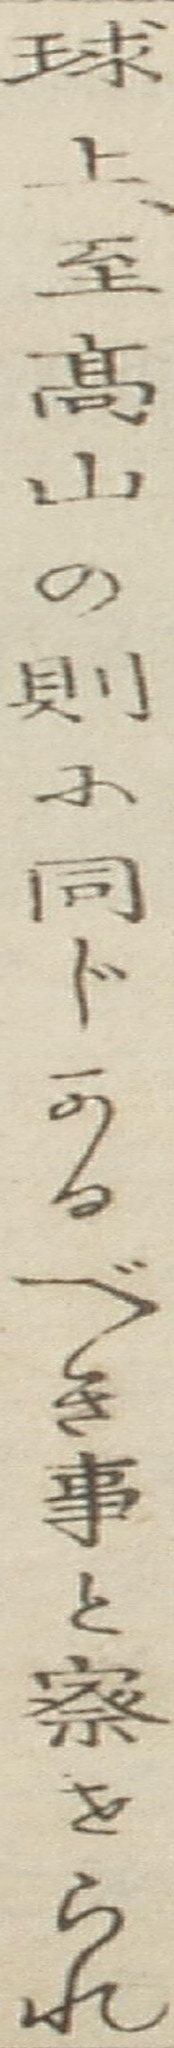球上、至高山の則に同じかるべき事と察せられ
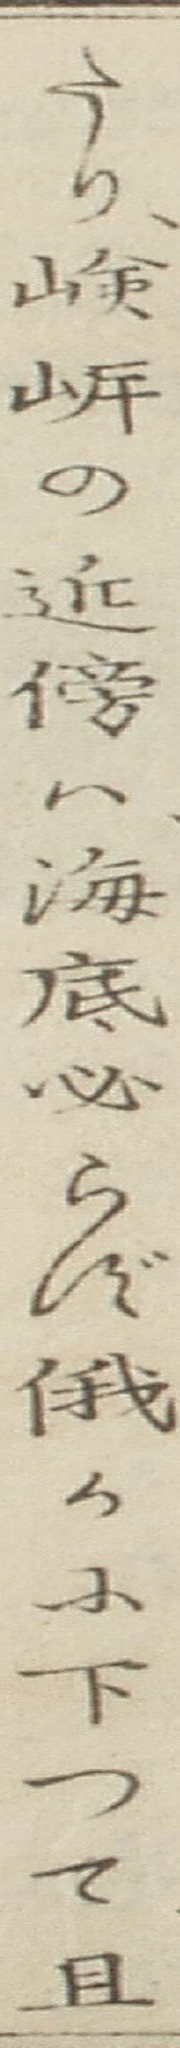たり、険㟁の近傍は、海底必らず俄かに下つて、且
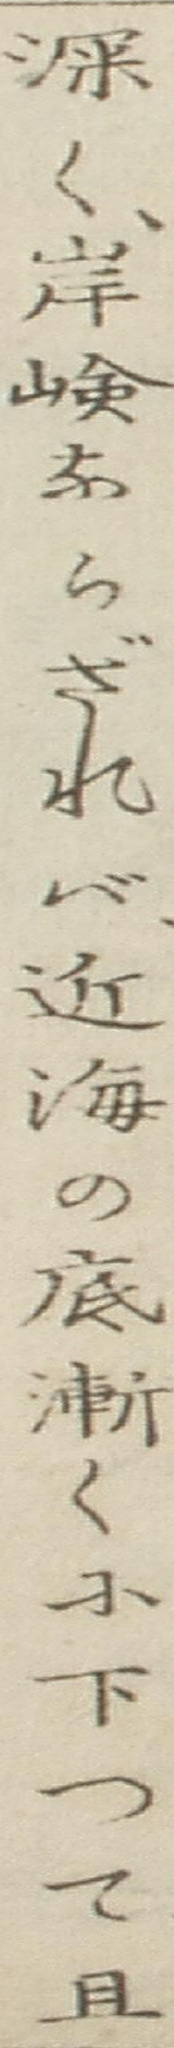深く、岸険ならざれば、近海の底漸くに下つて、且
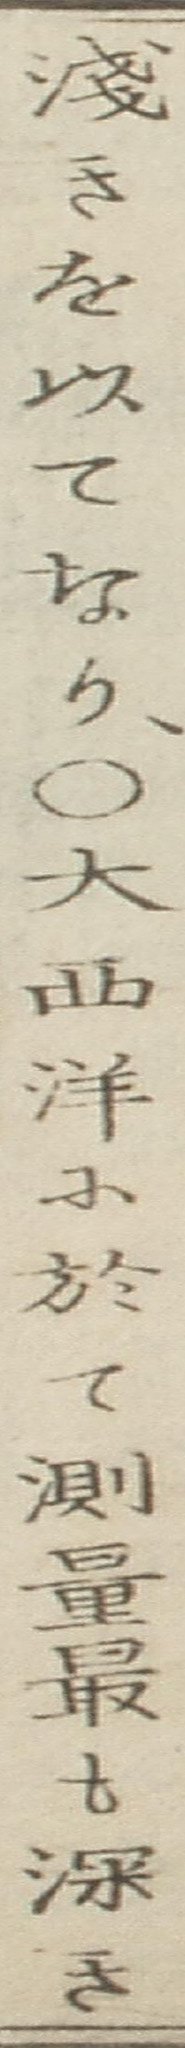浅きを以てなり、〇大西洋に於て測量最も深き
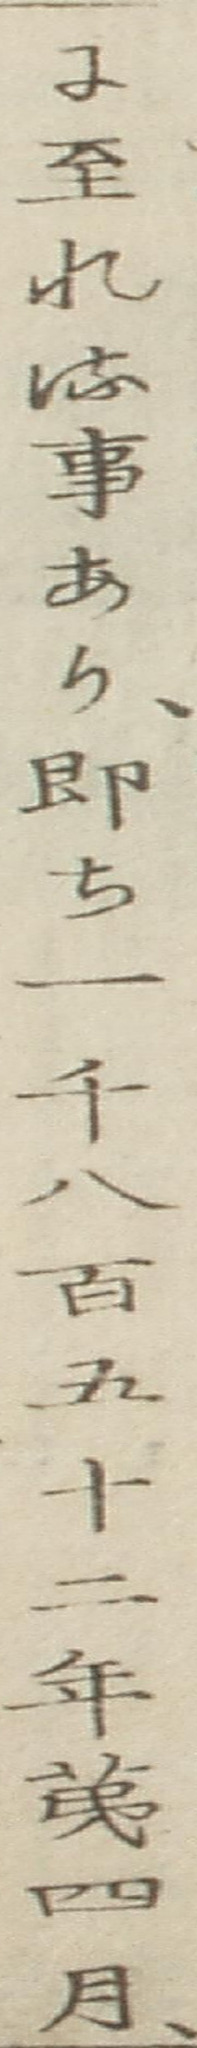に至れる事あり、即ち一千八百五十二年第四月、
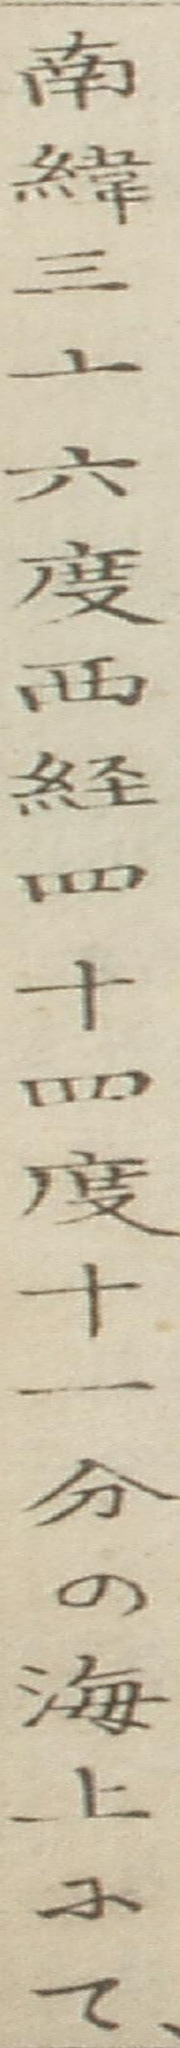南緯三十六度、西経四十四度十一分の海上にて、

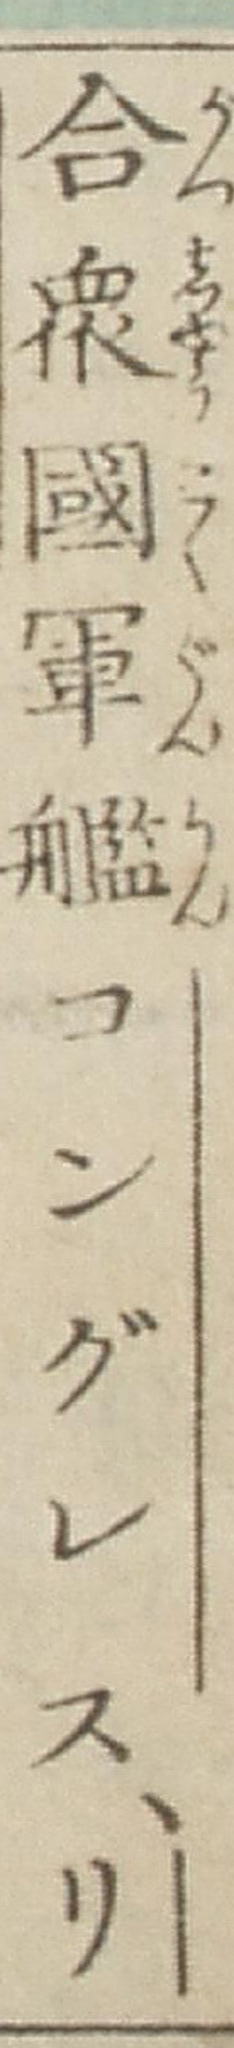合衆国軍艦コングレス、リ
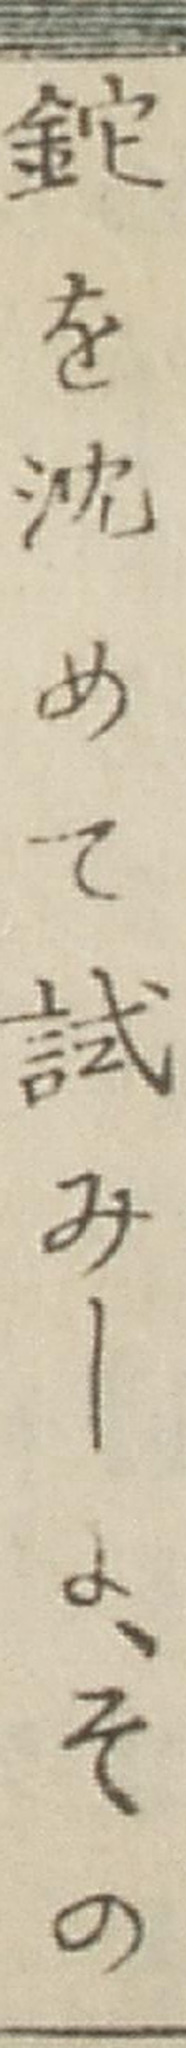鉈を沈めて試みしに、その
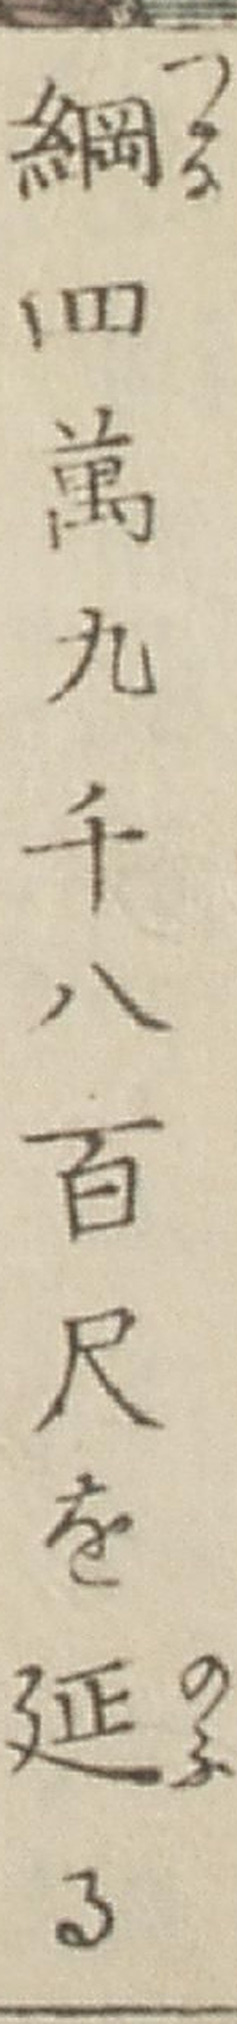綱四万九千八百尺を延る
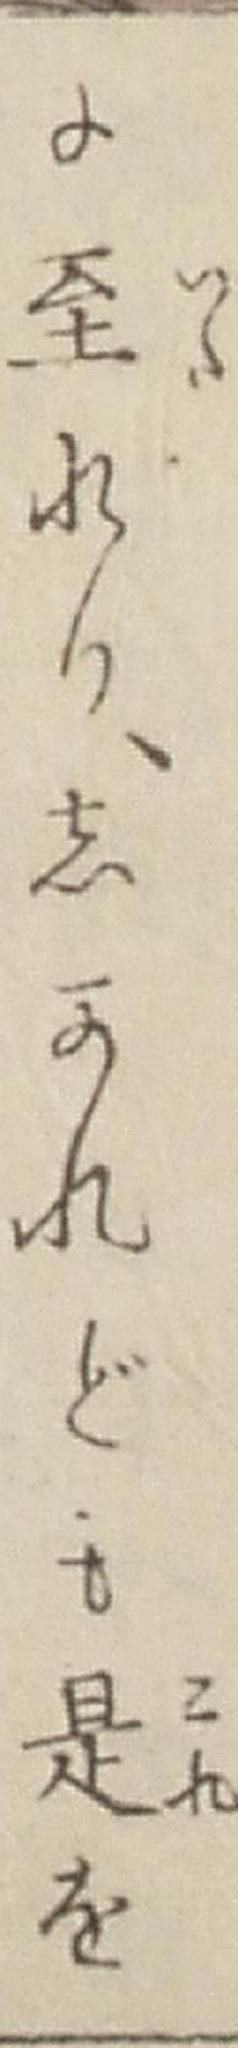に至れり、しかれども是を
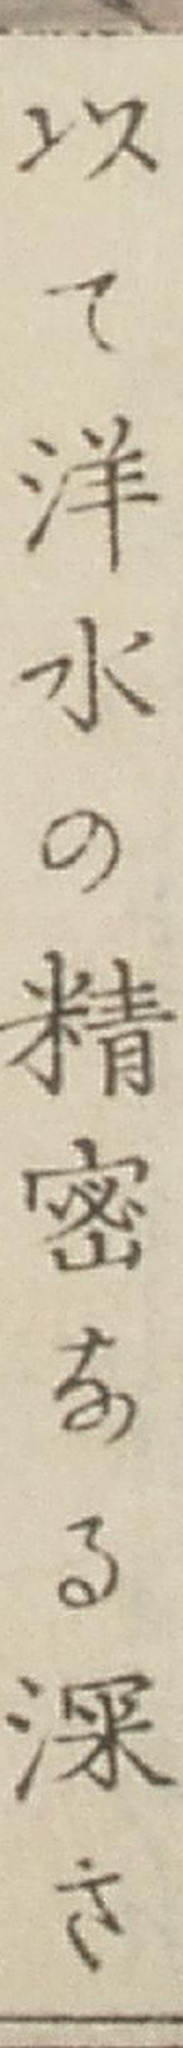以て洋水の精密なる深さ
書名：訓蒙　天然地理學　中
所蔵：東京大学地震研究所図書室 Earthquake Research Institute Library, The University of Tokyo, JAPAN
